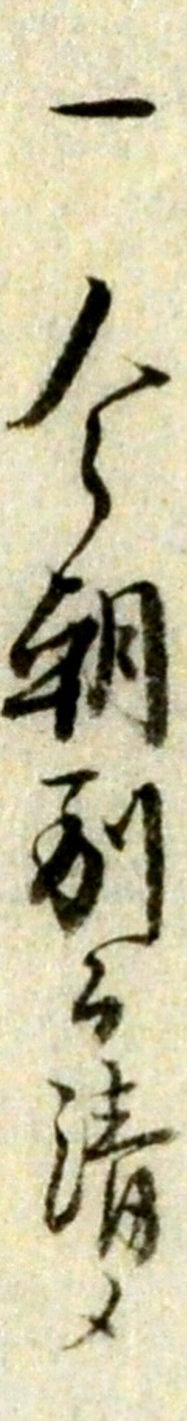一今朝別而清メ
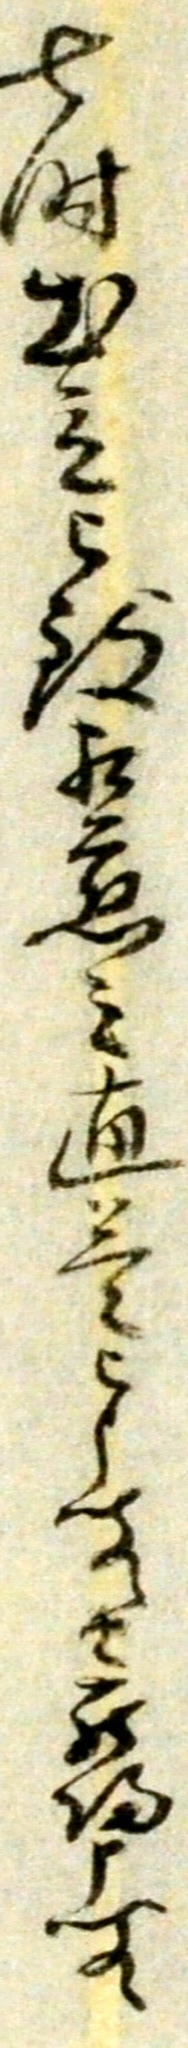七時出立被致相応之直答被申聞候由罷帰申聞候
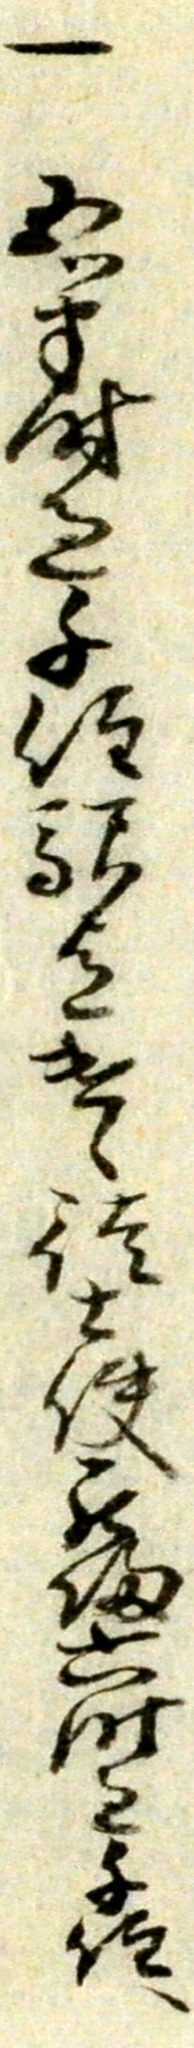一五ッ半時過千住駅迄遣候徒士使罷帰六時過千住へ
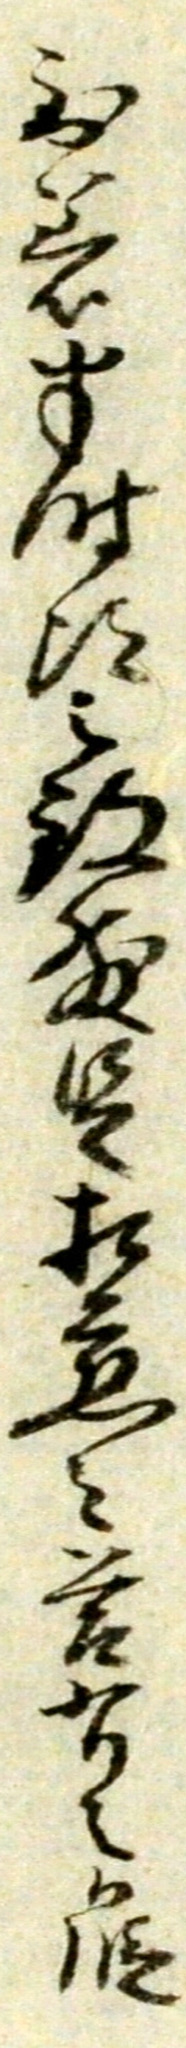到着半時頃被致発足相応之答有之候段
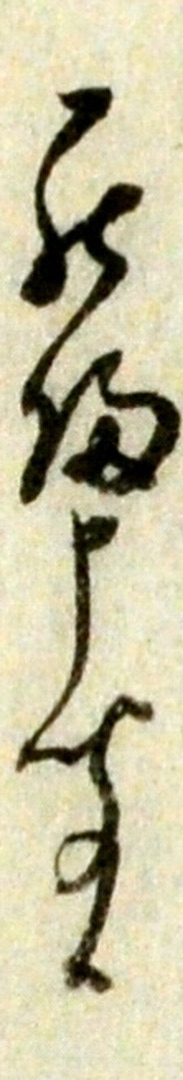罷帰申聞候
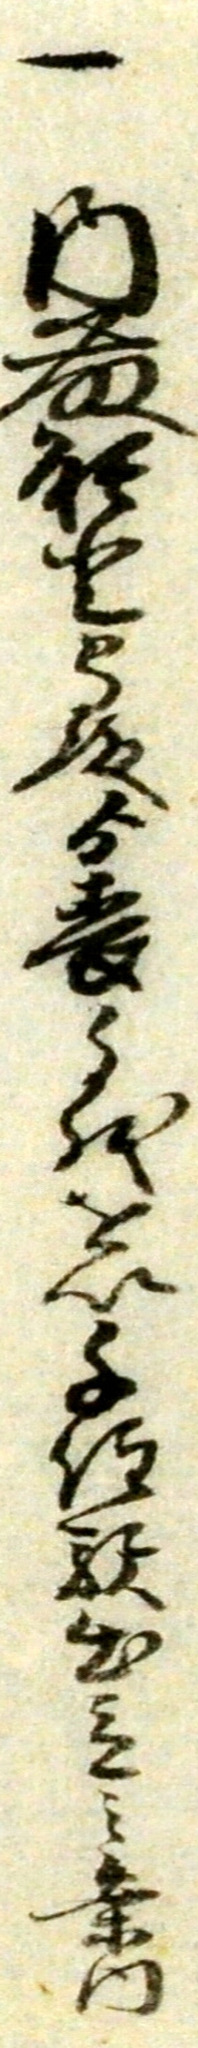一内藤能登守殿ゟ表手紙を以千住駅出立之案内
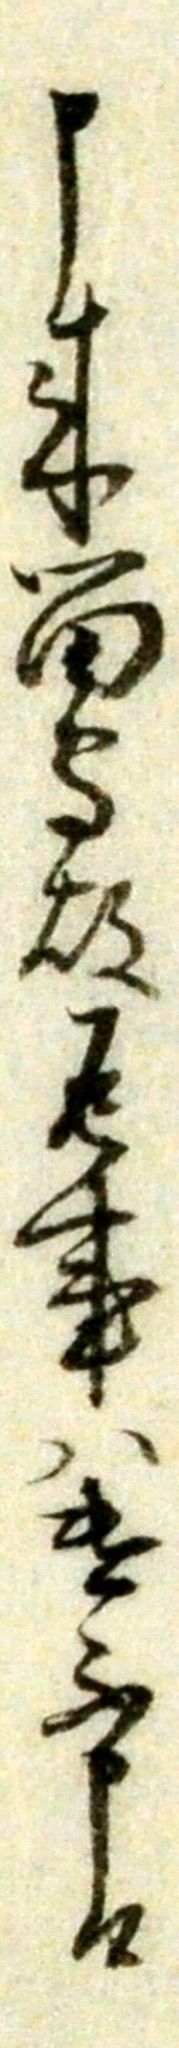申来留守故返事ハ遣不申候
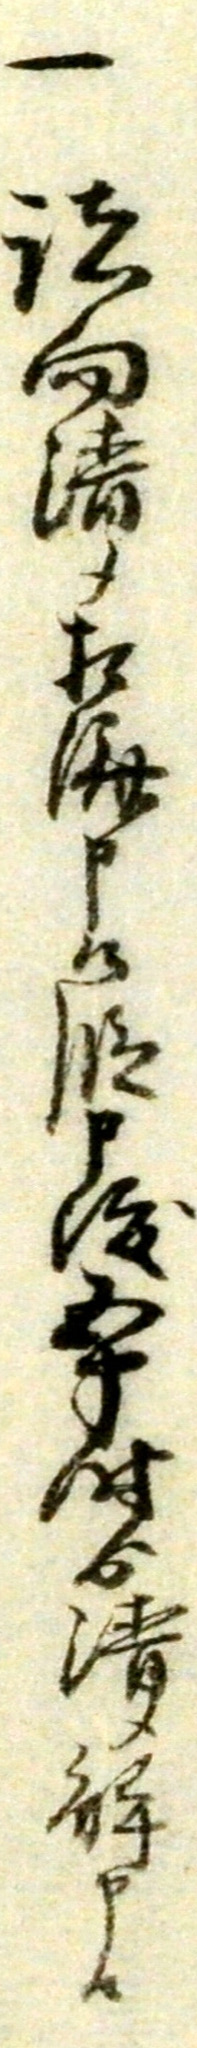一諸向清メ相済申候段申渡五半時ゟ清メ解申候
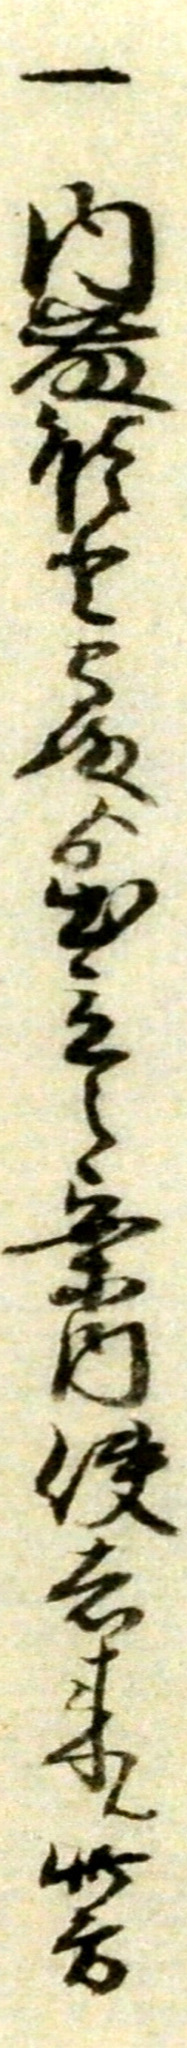一内藤能登守殿ゟ出立之案内使者来ㇽ此方
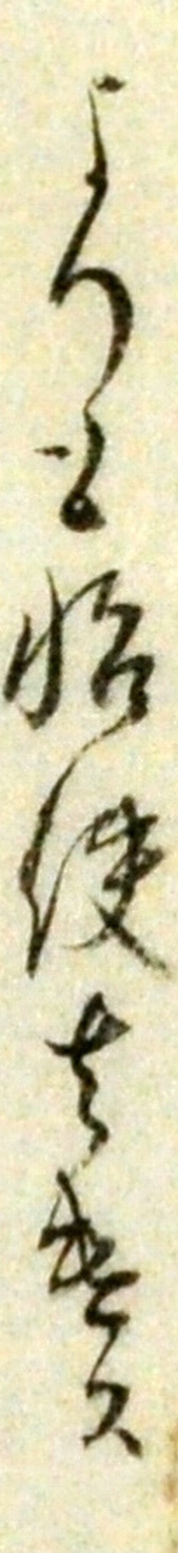よりも怡使者遣ㇲ
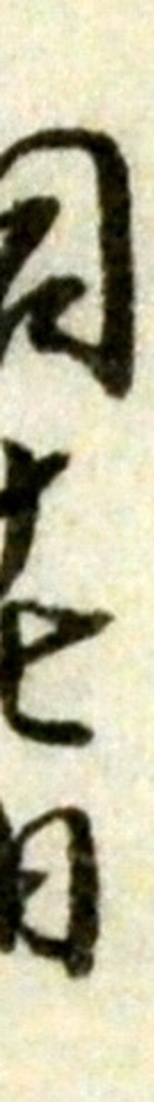同十七日

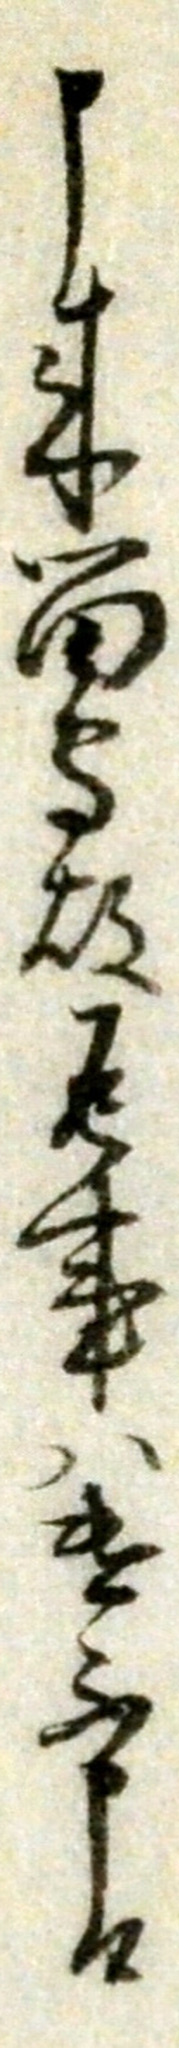申来留守故返事ハ遣不申候
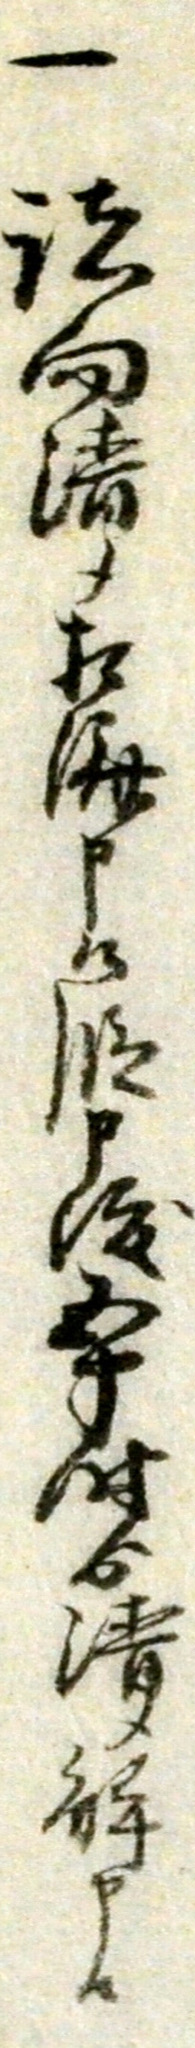一諸向清メ相済申候段申渡五半時ゟ清メ解申候
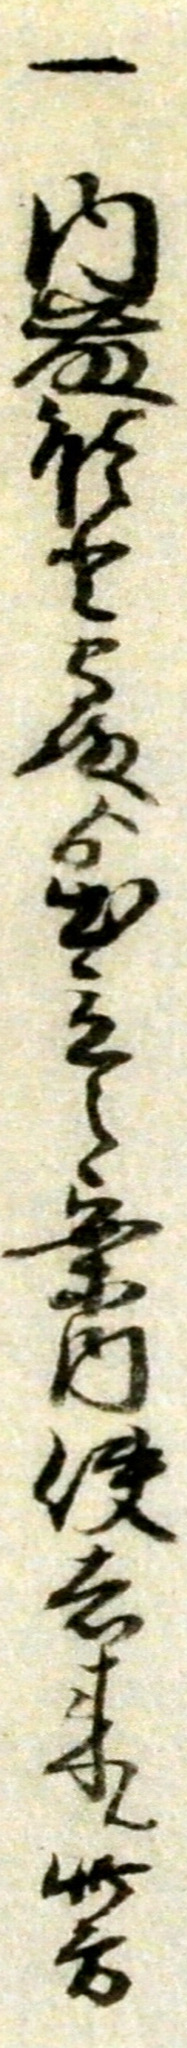一内藤能登守殿ゟ出立之案内使者来ㇽ此方
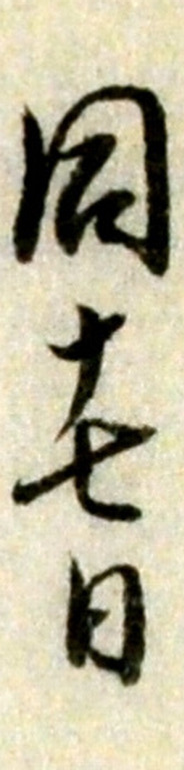同十七日
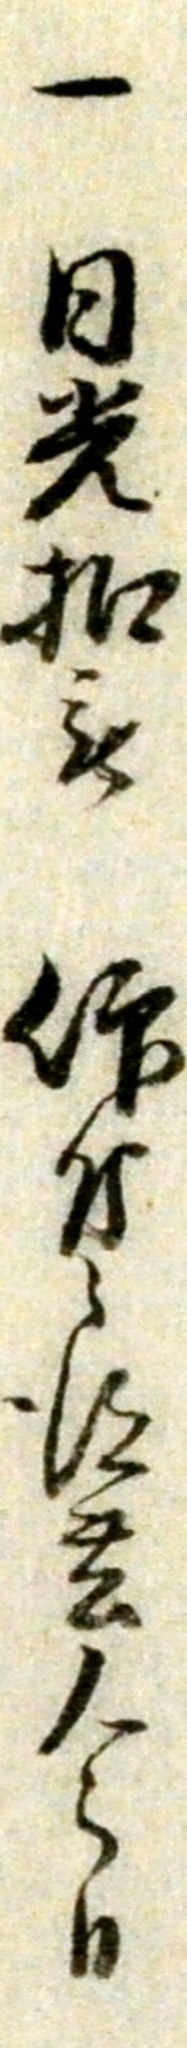一日光扣被仰付候得共今日
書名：日光御名代相勤候節ノ留
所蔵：伊那市立高遠町図書館・合同会社AMANE
